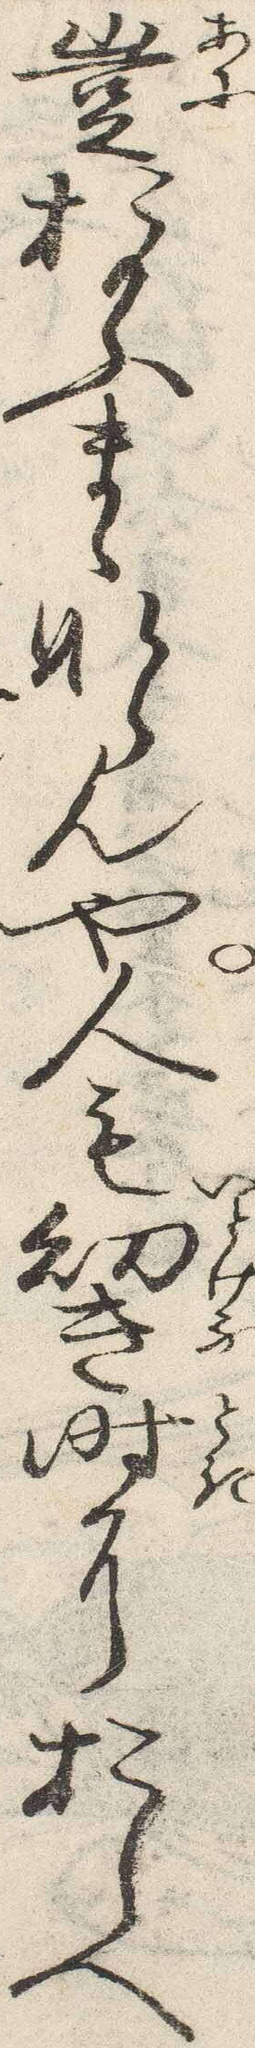豈おもふまゝならんや。人も幼き時におしへ
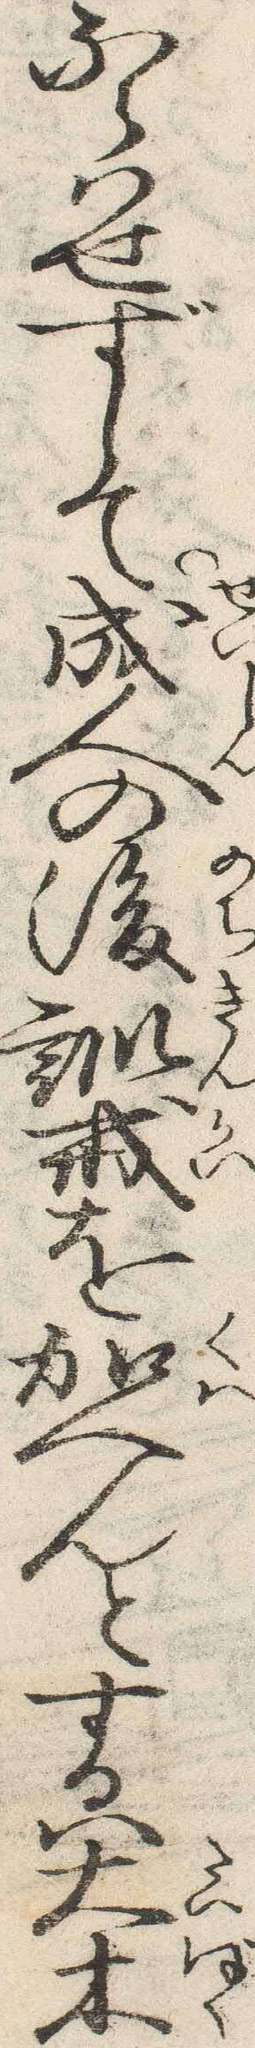ならはせずして。成人の後訓戒を加へんとするは大木
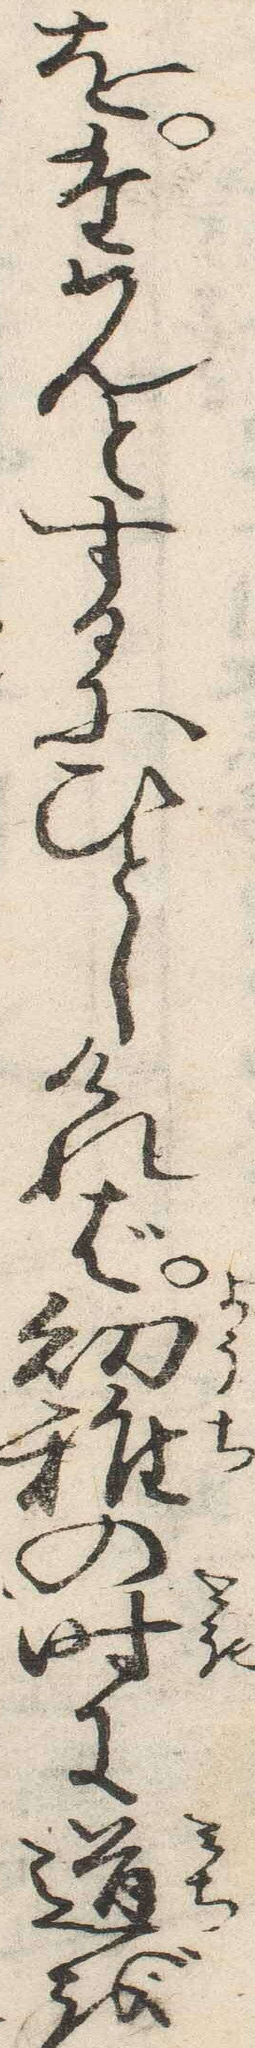を。ためんとするにひとしければ。幼稚の時に道を
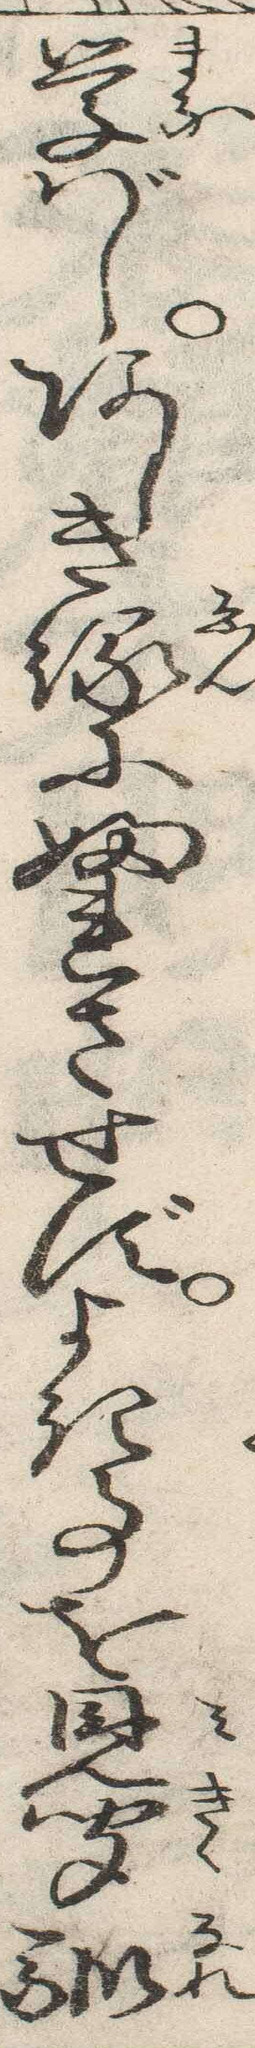学ばし。あしき縁にふれさせず。よき事を見聞馴
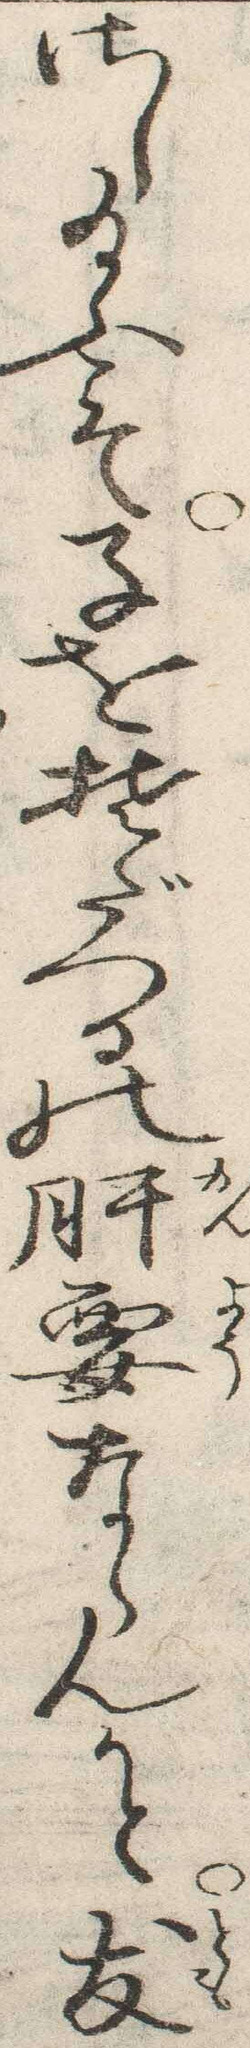さし給ふこそ。子をそだつるの肝要ならんかと。友
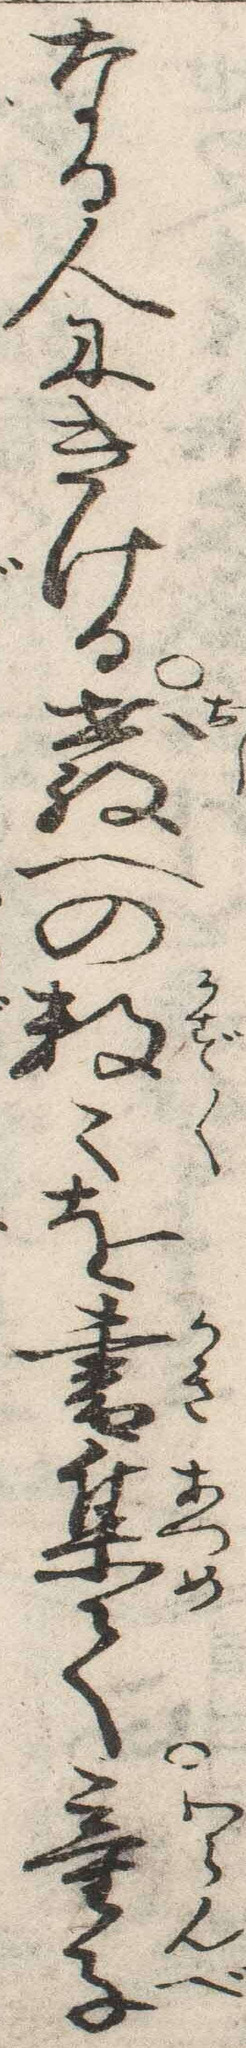なる人にきける。教への数々を書集て。童子
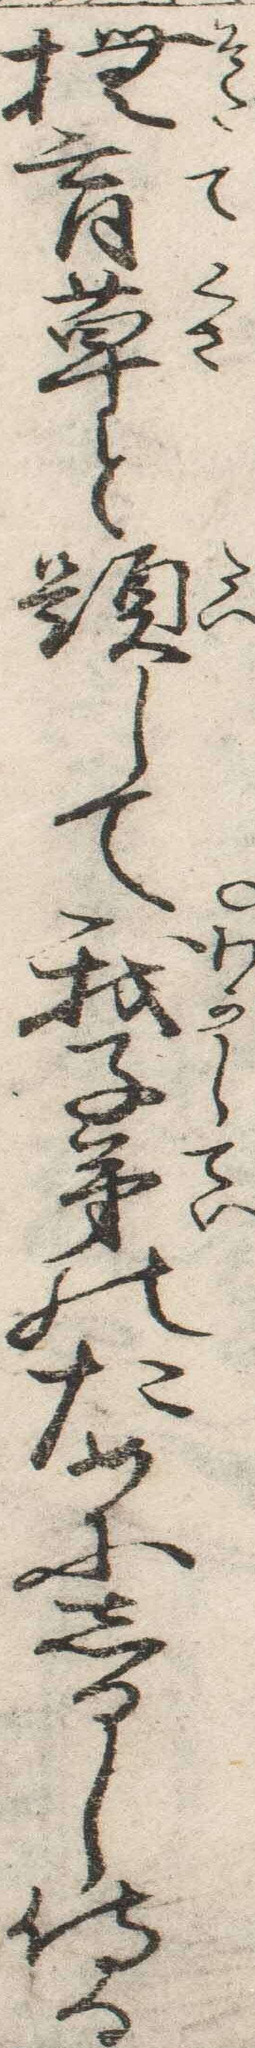撫育草と題して。我子弟のためにしるし伝る

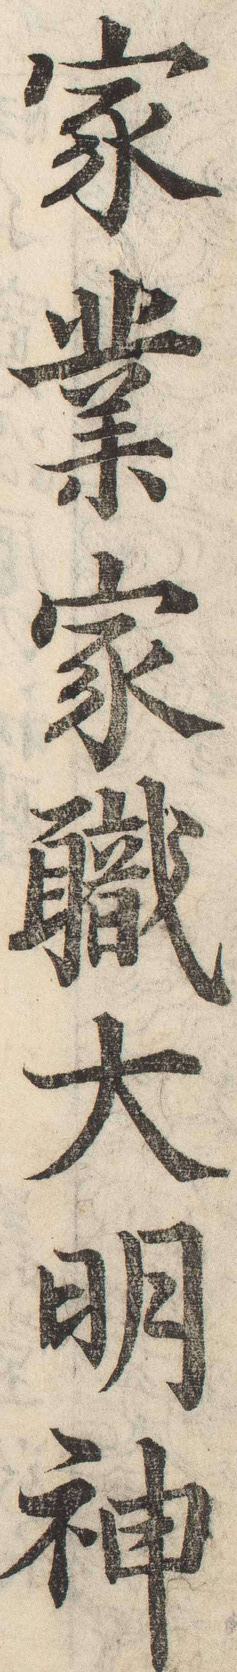家業家職大明神
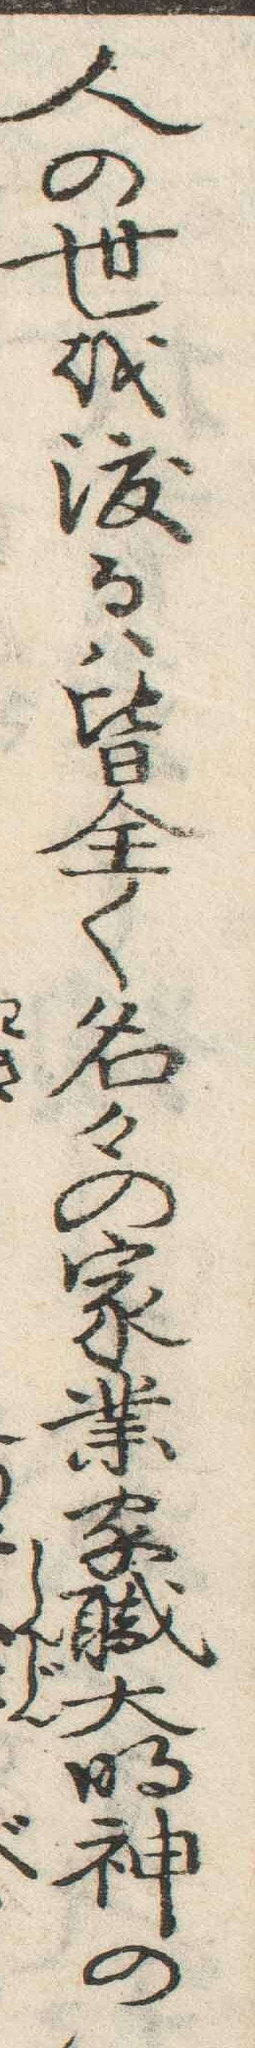人の世を渡るは皆全く名々の家業家職大明神の
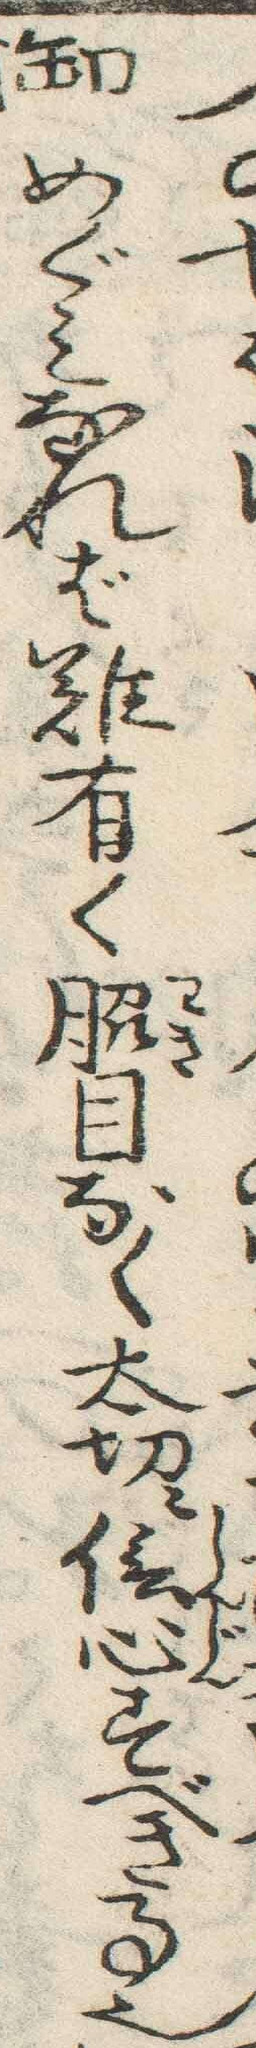御めぐみなれば難有く脇目なく太切に信心すべき事也
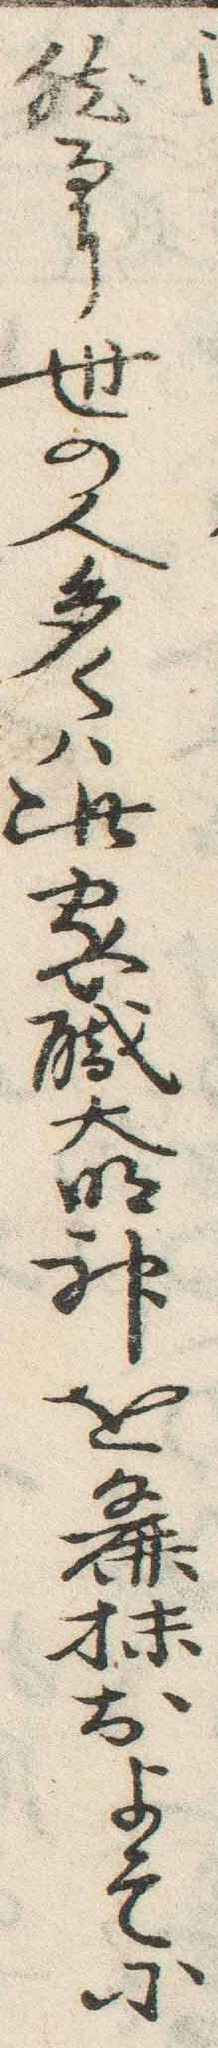然るに世の人多くは此家職大明神を麁抹およそに
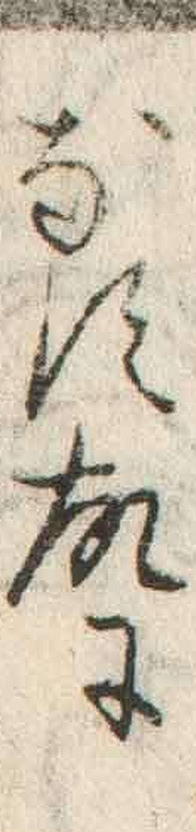なす故に
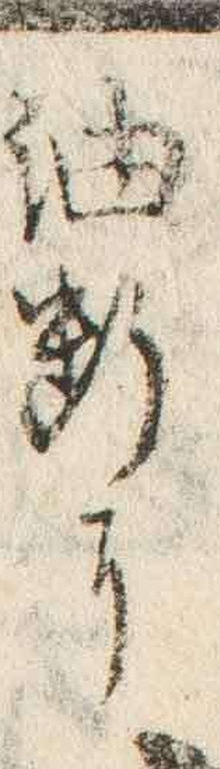油断に
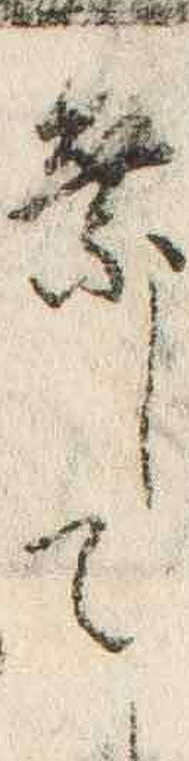乗して
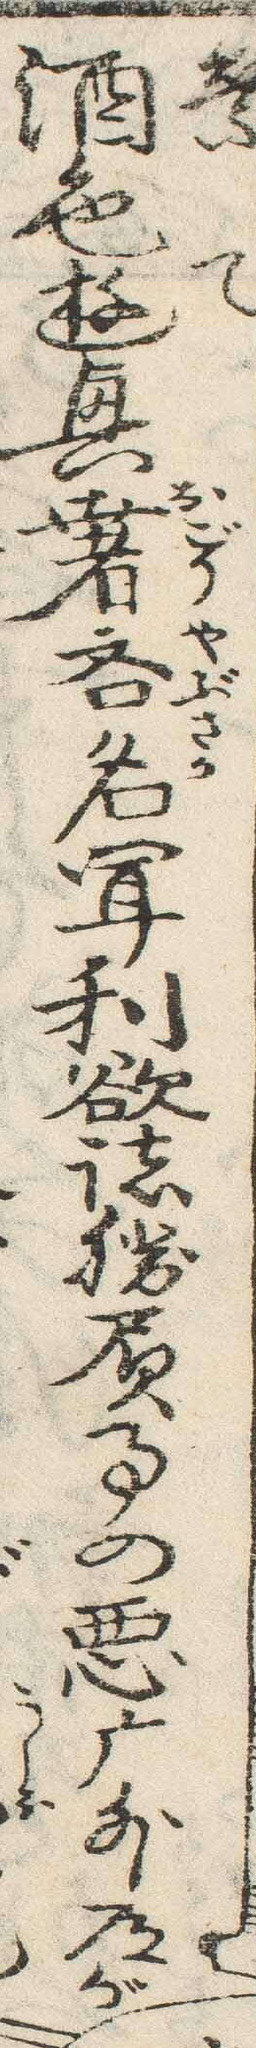酒色遊興奢吝名聞利欲諸勝屓事の悪歴外道が
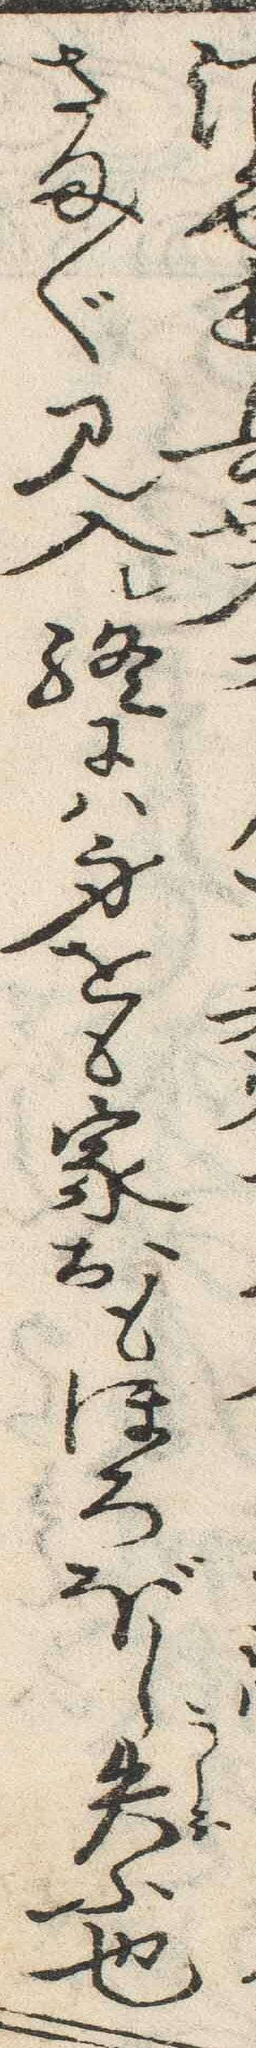さま〴〵見入れ終には身をも家おもほろぼし失ふ也
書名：撫育草
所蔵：東京学芸大学附属図書館 国文学研究資料館
